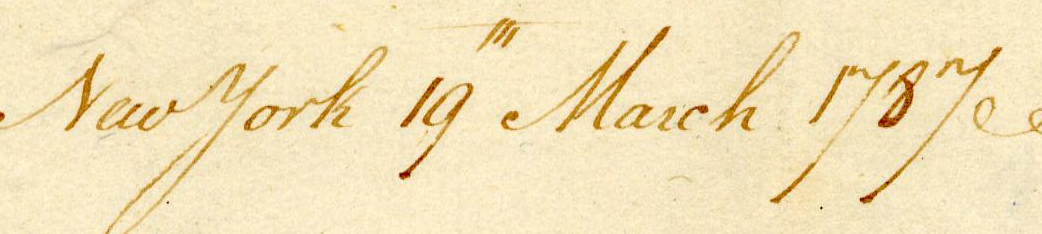New York 19^th March 1787
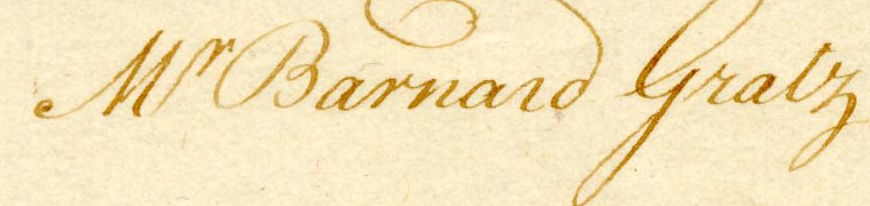M^r Barnard Gratz
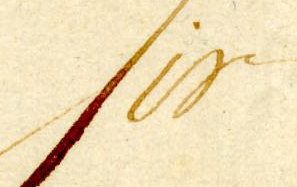Sir
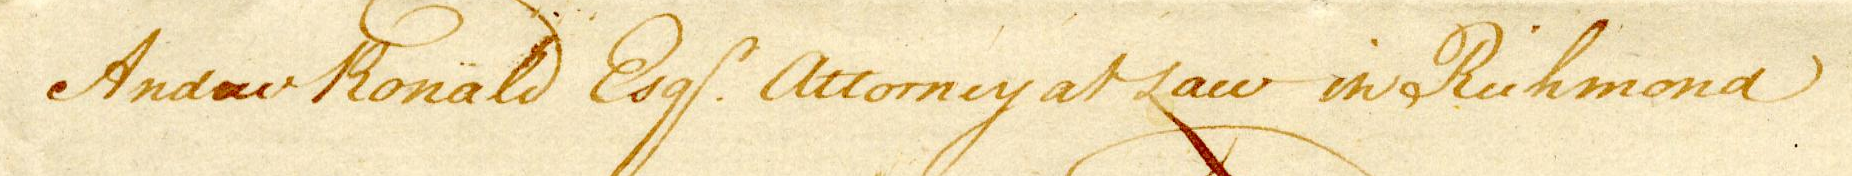Andrew Ronald Esq^r. Attorney at Law in Richmond
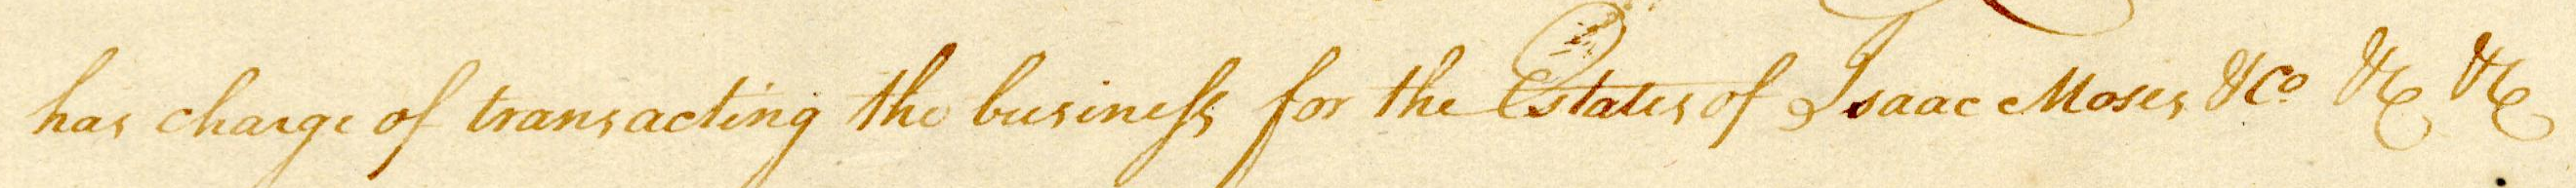has charge of transacting the business for the Estates of Isaac Moses & Co &c &c
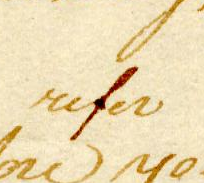refer
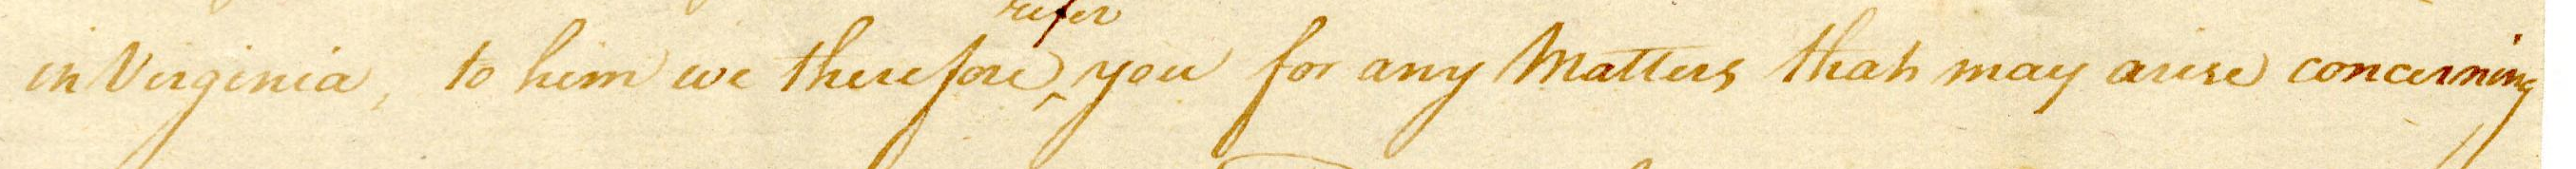in Virginia, to him we therefore ^ you for any Matters that may arise concerning
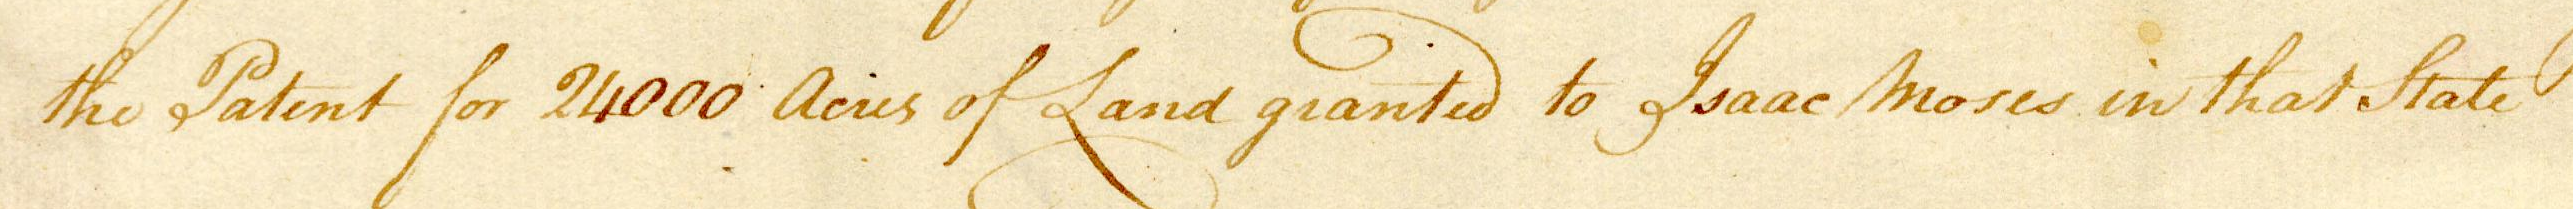the Patent for 24000 acres of Land granted to Isaac Moses in that State
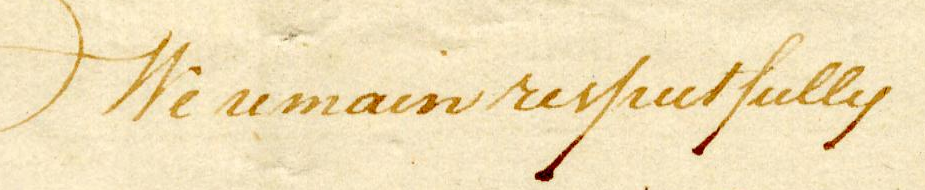We remain respectfully
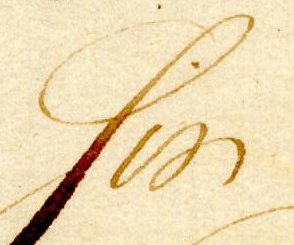Sir
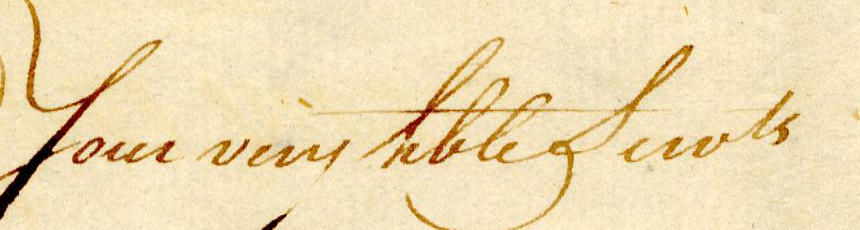Your very hble Serv^ts
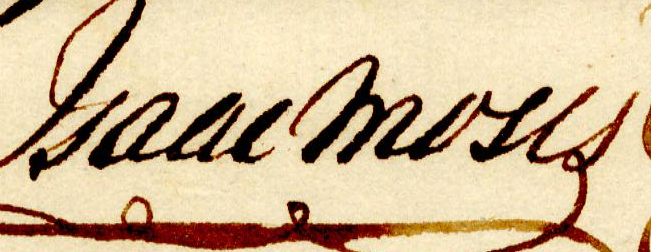Isaac Moses
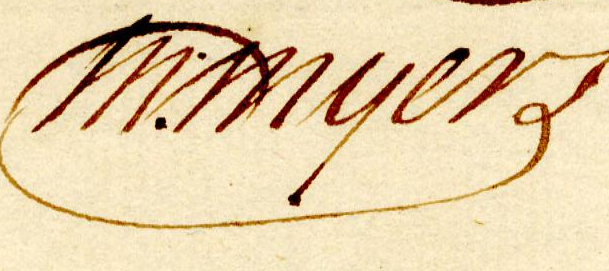M. Myers
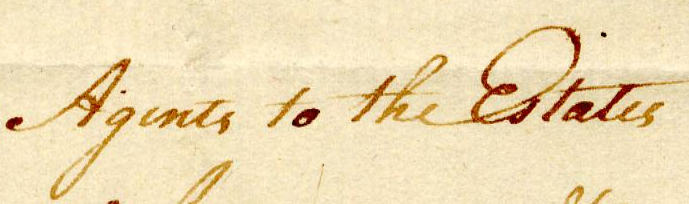Agents to the Estates
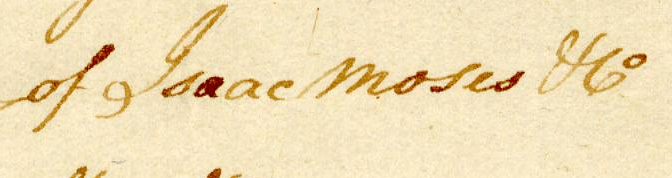of Isaac Moses &C^o
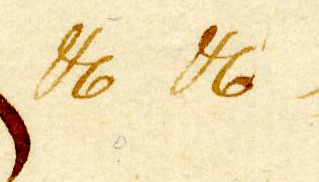&c &c
